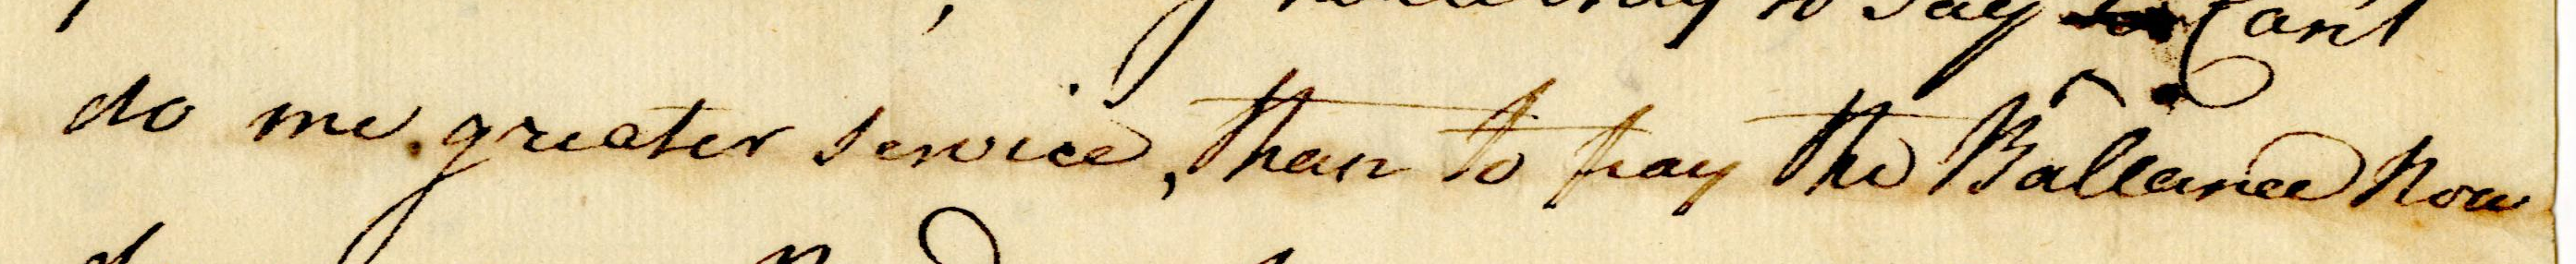do me greater service, than to pay the Ballance Now
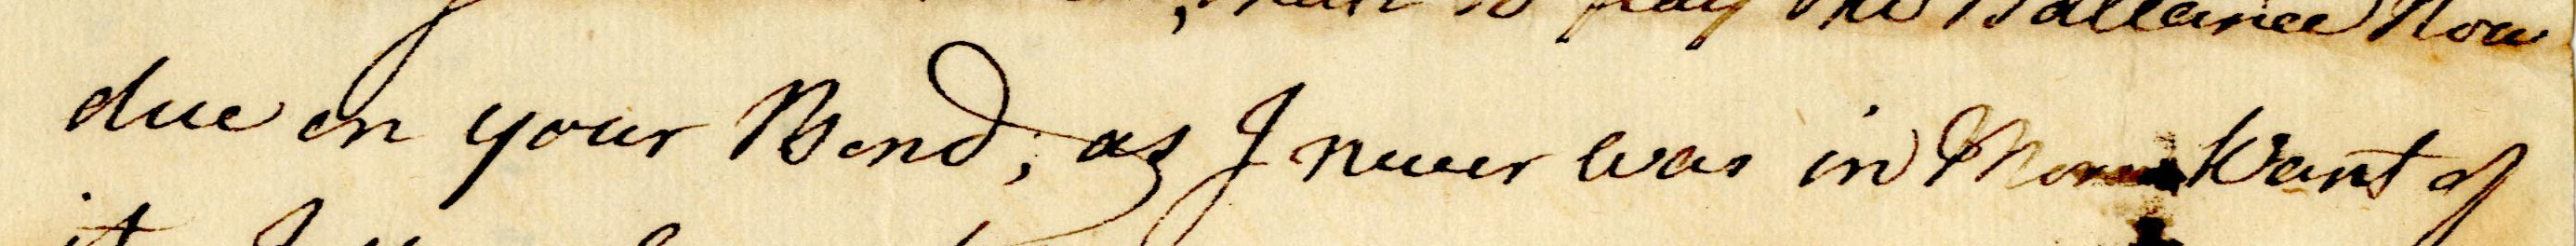due on your Bond; as I never was in More Want of
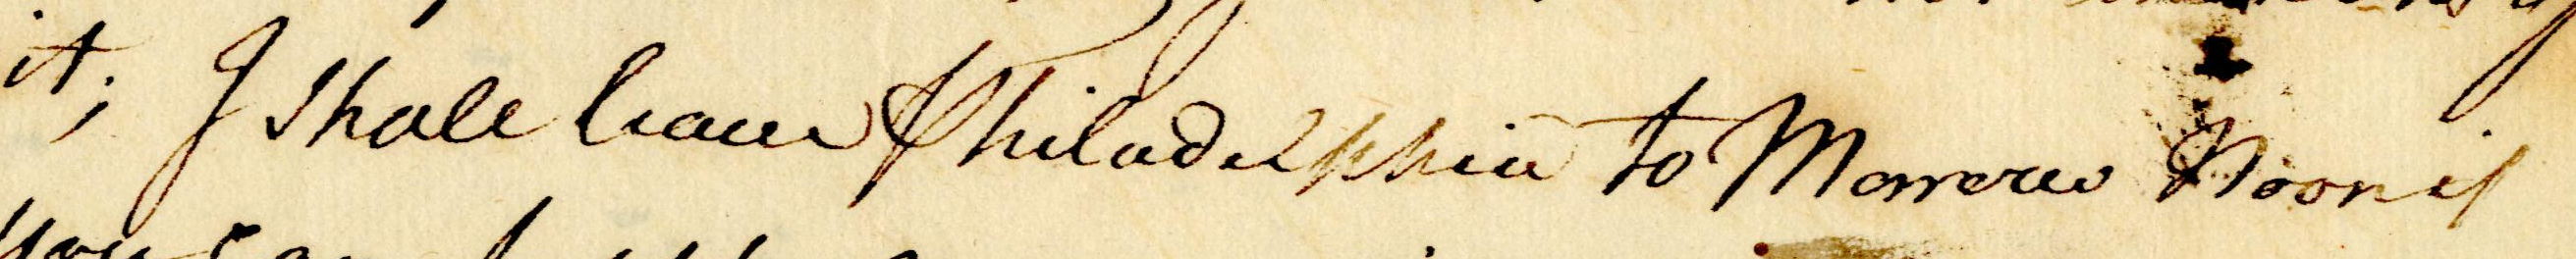it, I shall leave Philadelphia to Morrow noon if
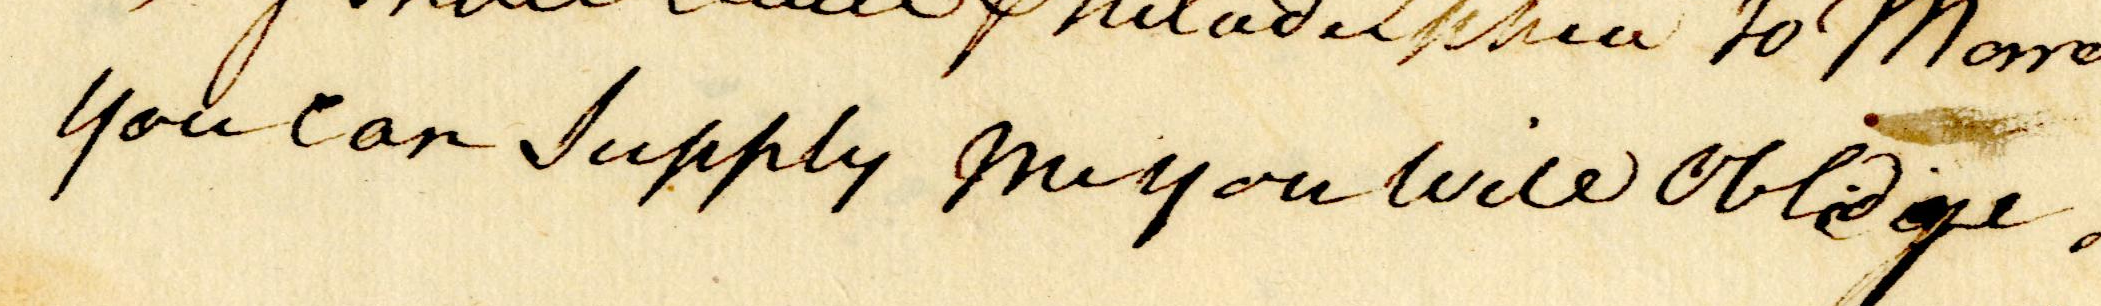You can Supply me you will oblidge
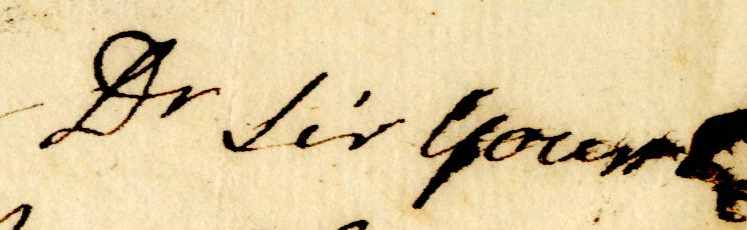D^r Sir yours
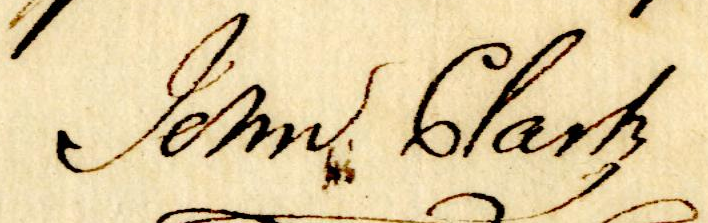John Clark
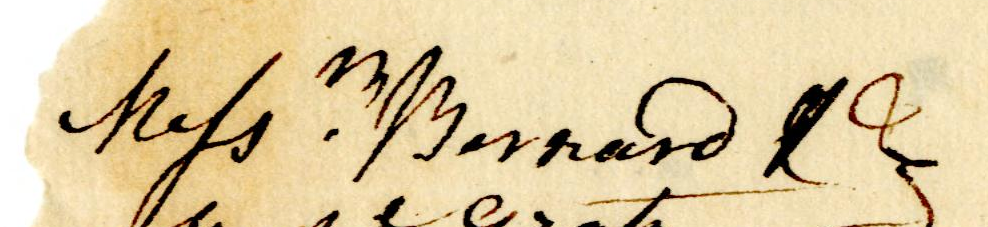Mess^rs Barnard &
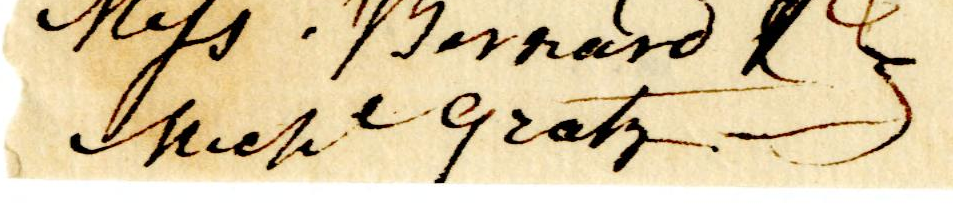Mich^l Gratz.-
